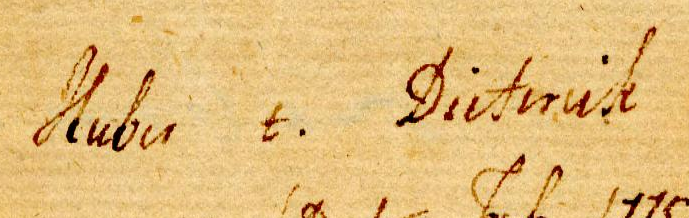Huber t. Disterick
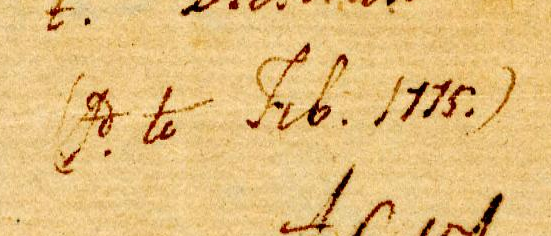(to. to Feb. 1775.)
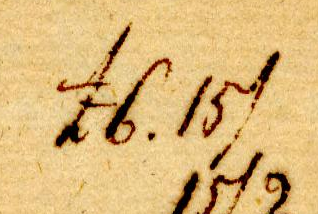£6. 15s
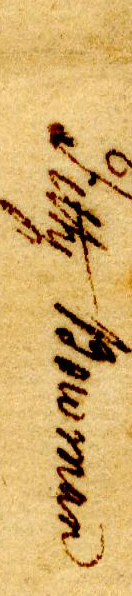Fetty Bowman
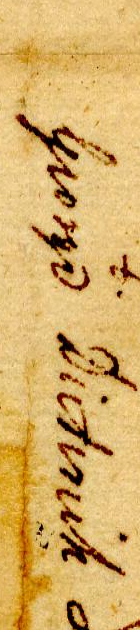George Dietrick
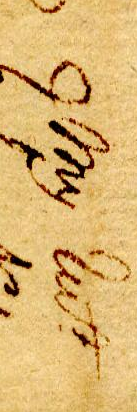My Ret.
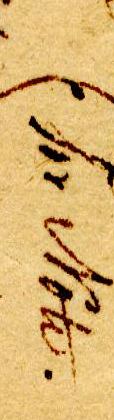for Note.
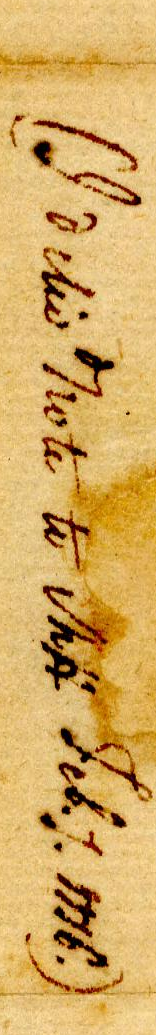(I deliv^d note to Sheff. Feb. 7. 1776)
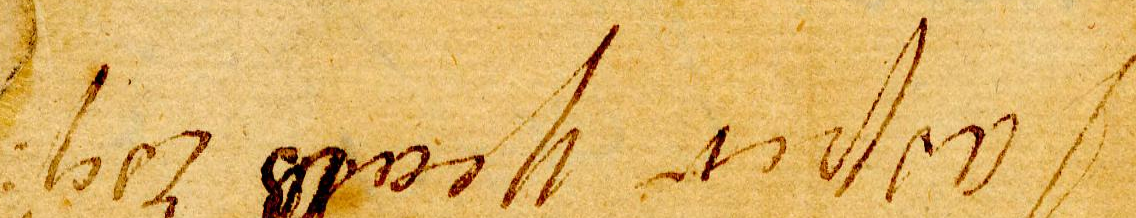Jasper Yeatts Esq^r.
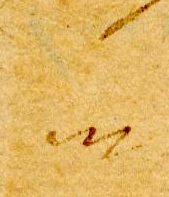in
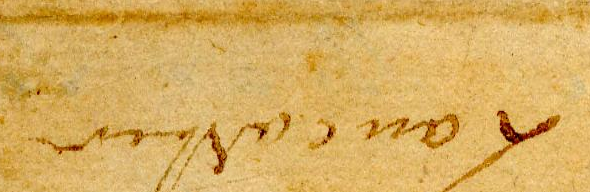Lancaster
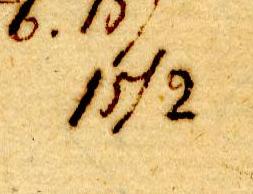15s2
